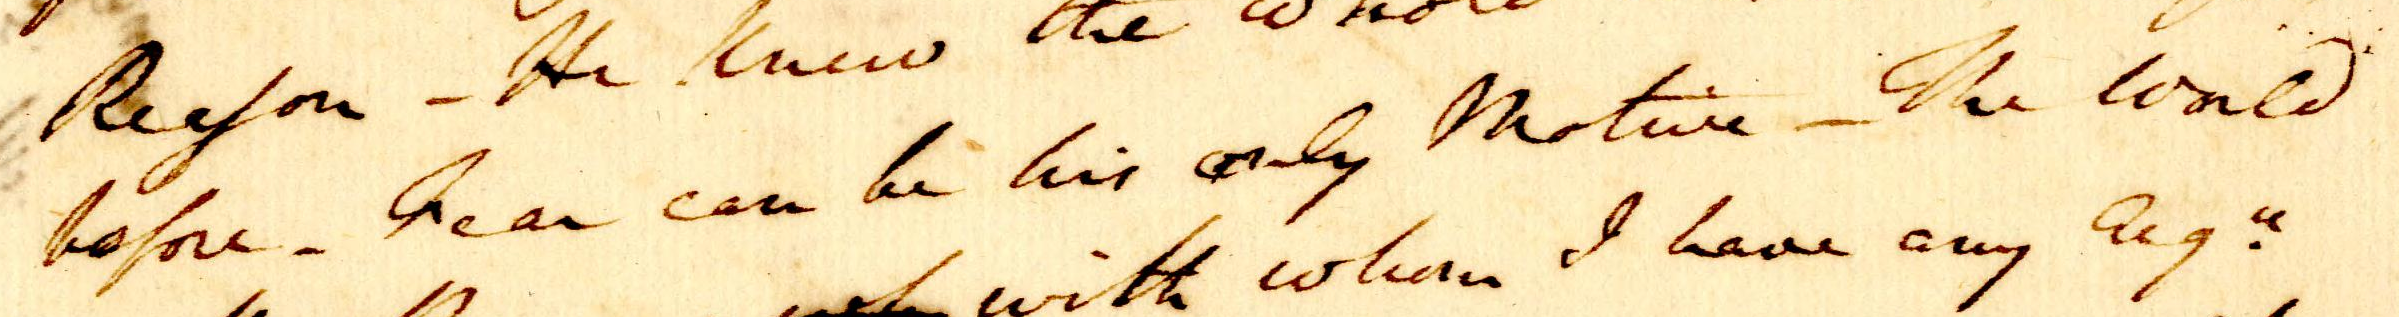before. Fear can be his only Motive. The World
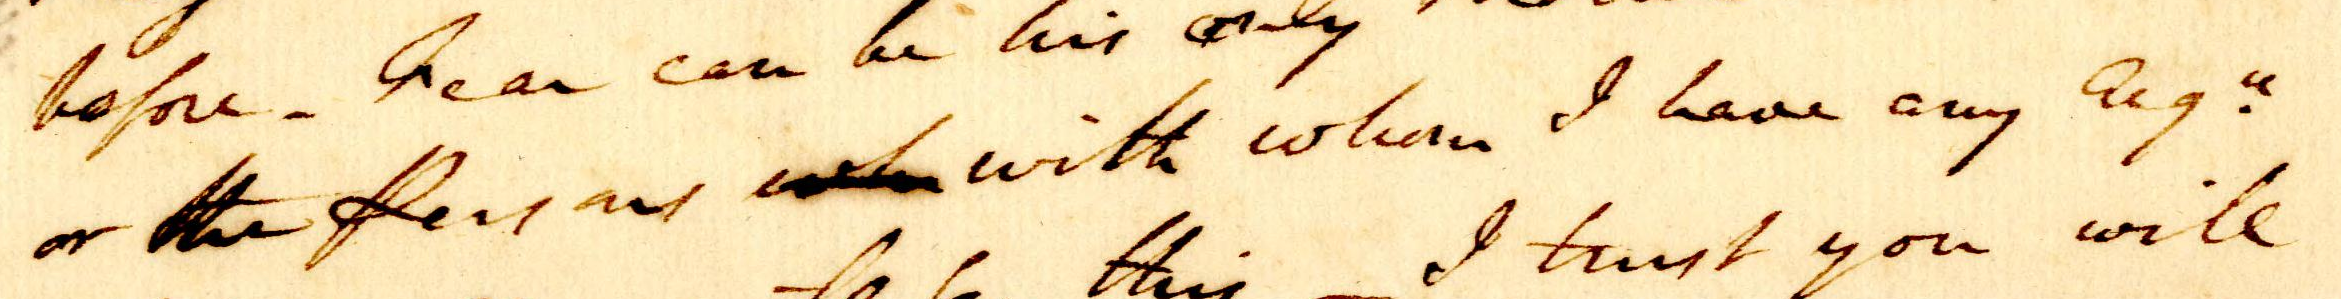or the Persons [___] with whom I have any reg^r.
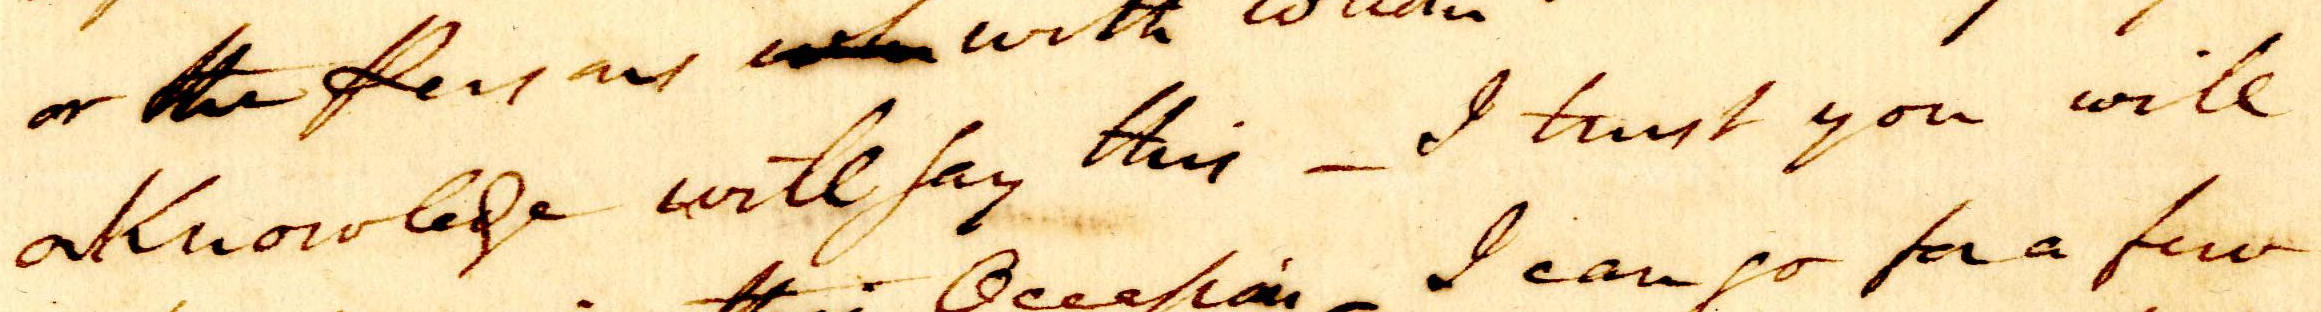Knowledge will say this. I trust you will
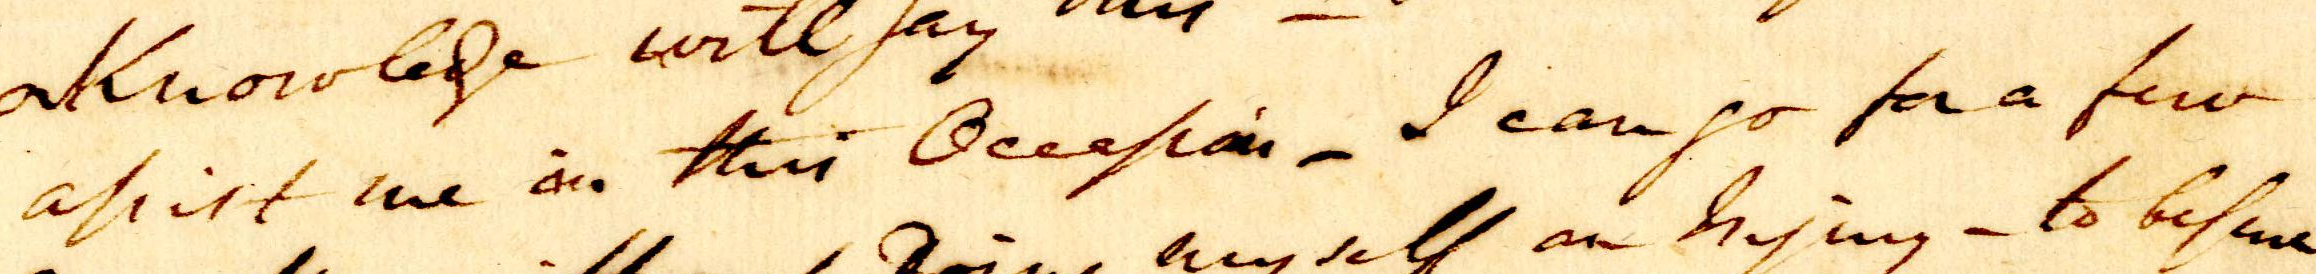assist me on this Occasion. I can go for a few
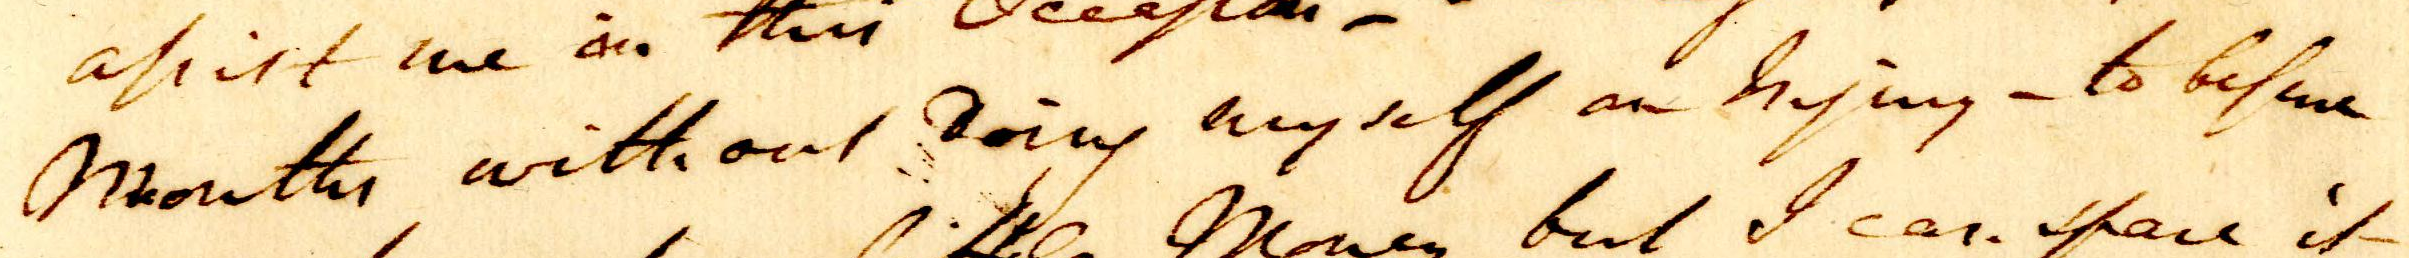Months without doing myself an Injury- to believe
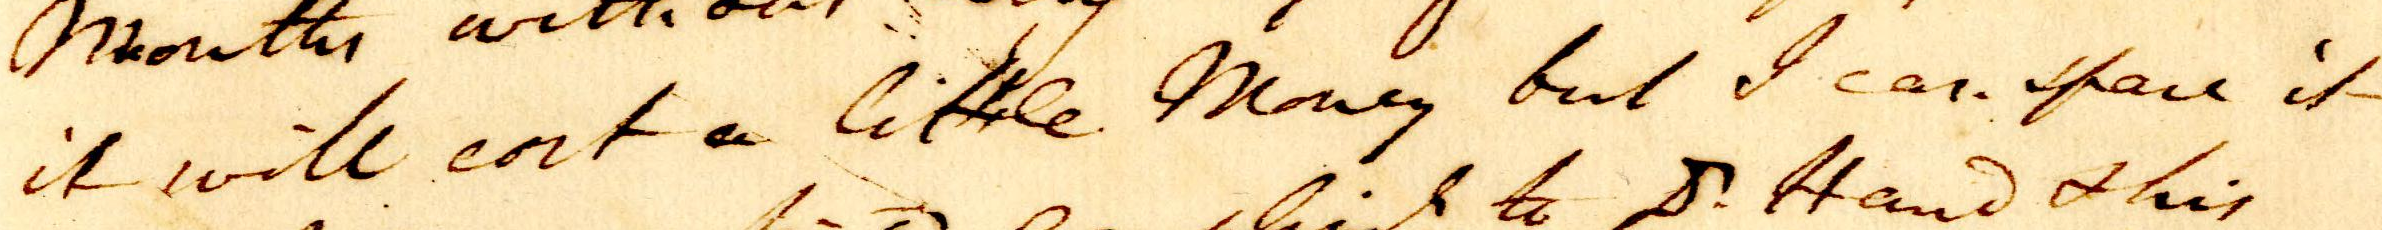it will cost a little Money but I can spare it
